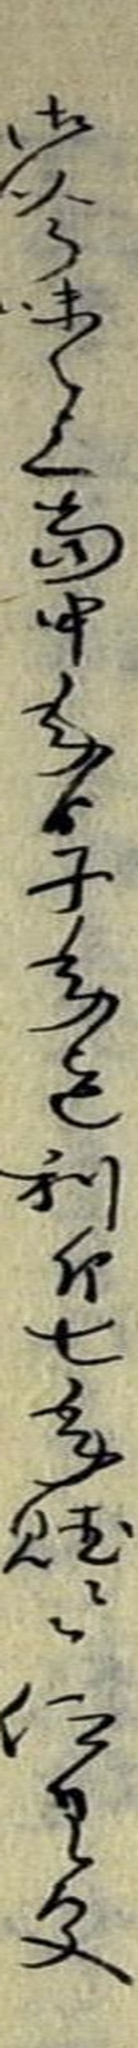御吟味之上当申年ゟ刁年迄利付七年賦に被仰付候事
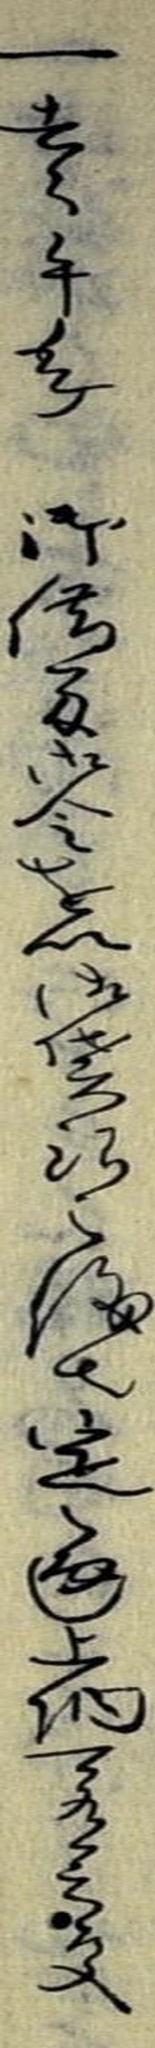一去々午年御借米御金を以御貸銀之儀は定之通上納可有之事
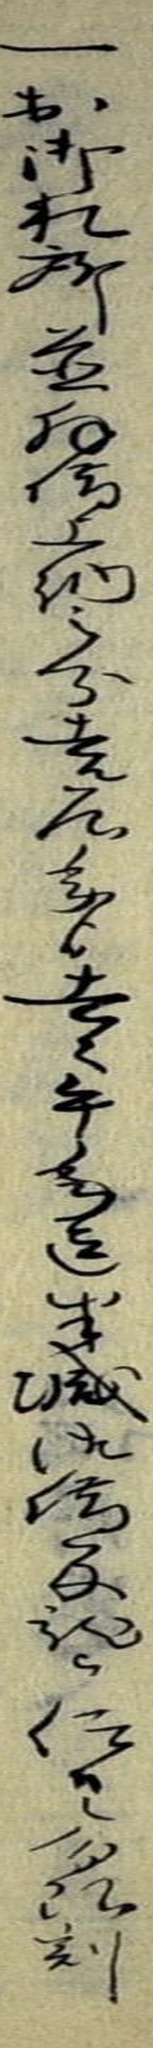一於御札所並拝借上納之分去る辰年ゟ去々午年迄半減御借米就被仰付候分限割
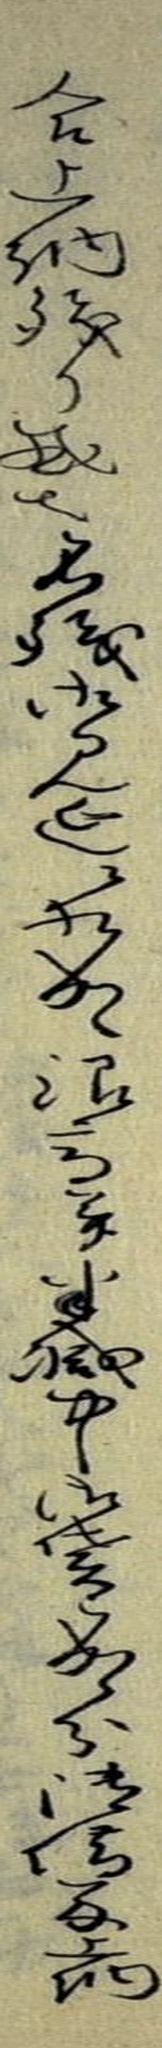合上納残り或は不残御見延に相成候銀高并半減中御貸被成候分御借米上納
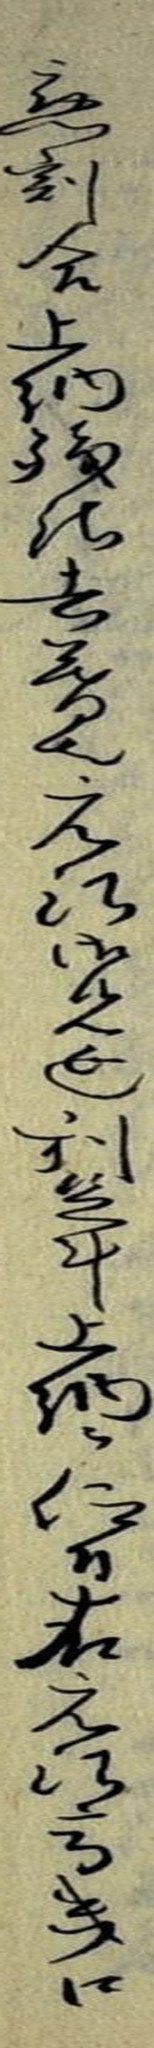応割合上納残銀去暮は元銀御見延利足斗上納被仰付右元銀高幾口
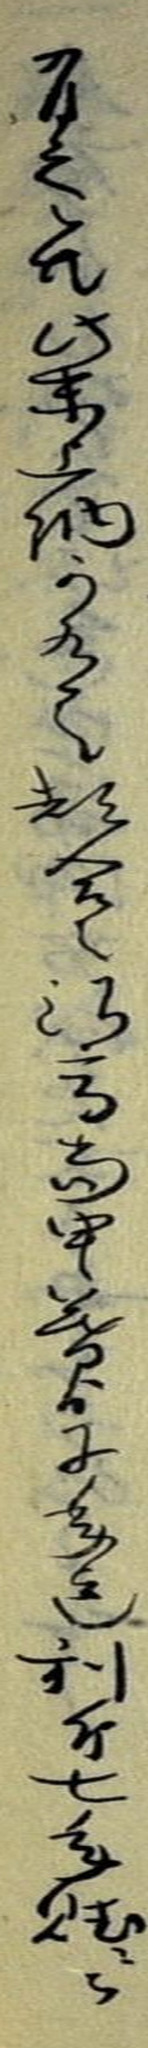有之候共此末上納可有之都合之銀高当申暮ゟ刁年迄利付七年賦に被
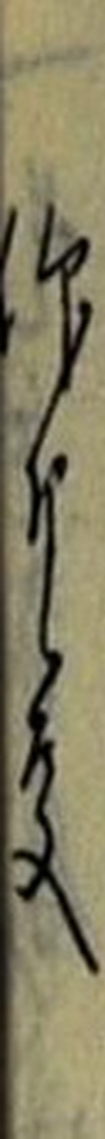仰付候事
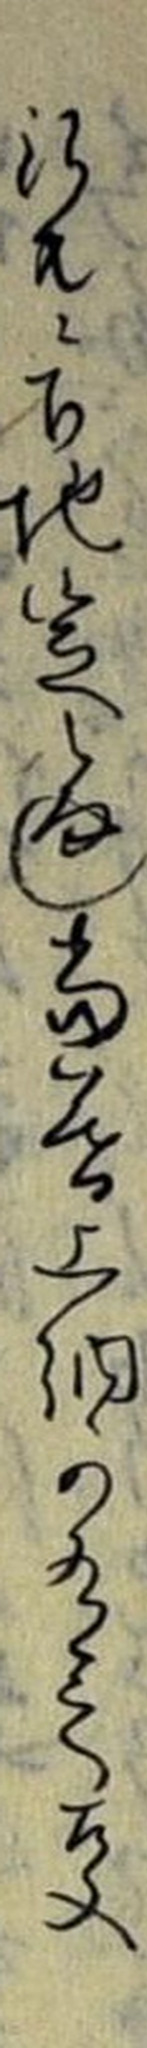銀共に下地定之通当暮上納可有之事
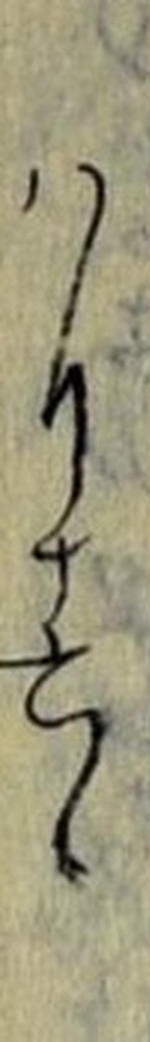八月十六日
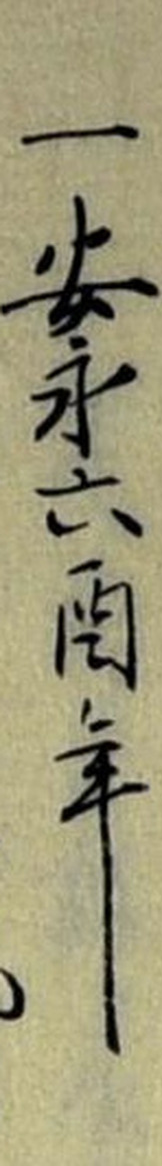一安永六酉年
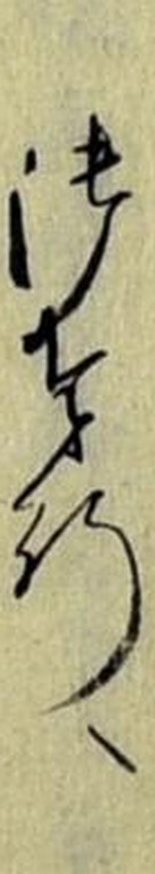御奉行へ
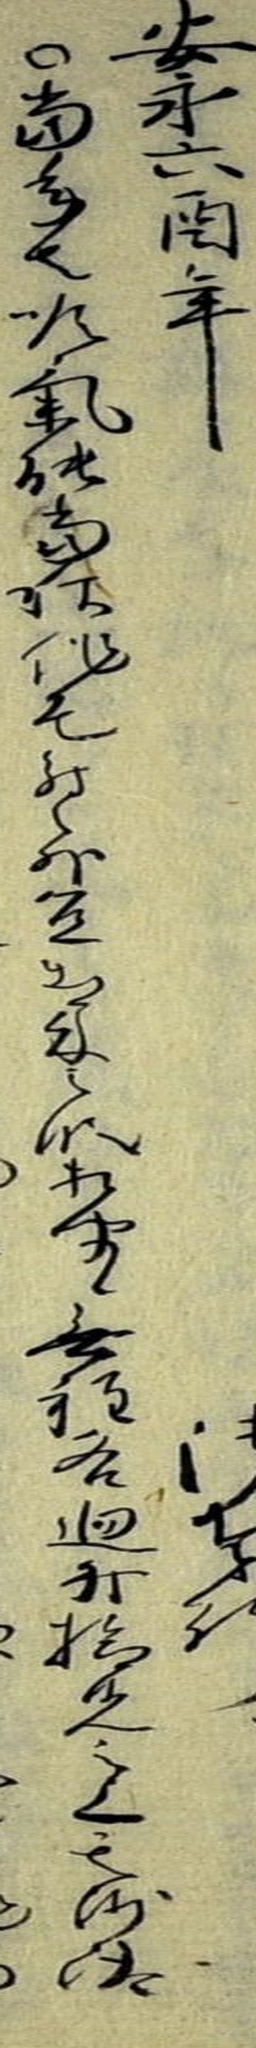〇当年は順気能当秋作毛殊之外宜出来之段相聞候無程各廻村検見之上其沙汰
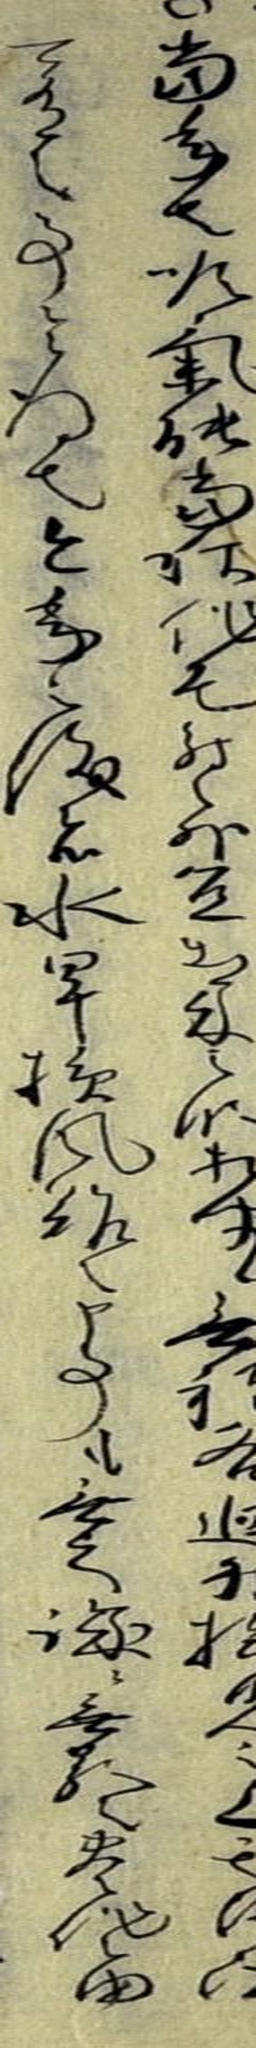可有之事に候得は今年之儀は水旱損風難之申事も無之誠に無類之農作之由
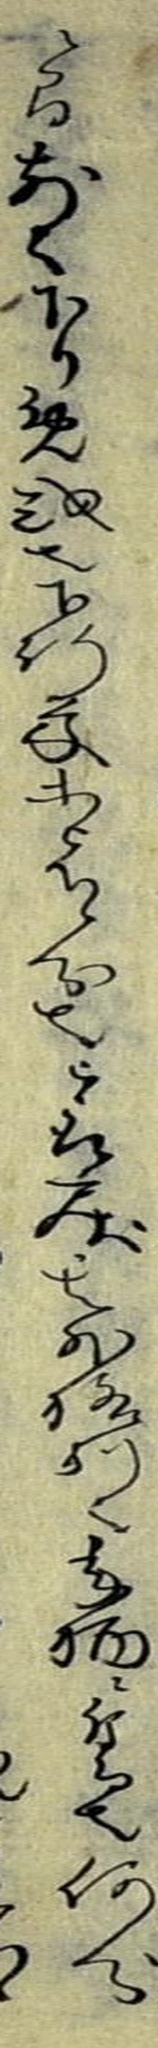候間前々下り免或は下行米等被下候分は被取戻其外格別之年柄に付而は何分
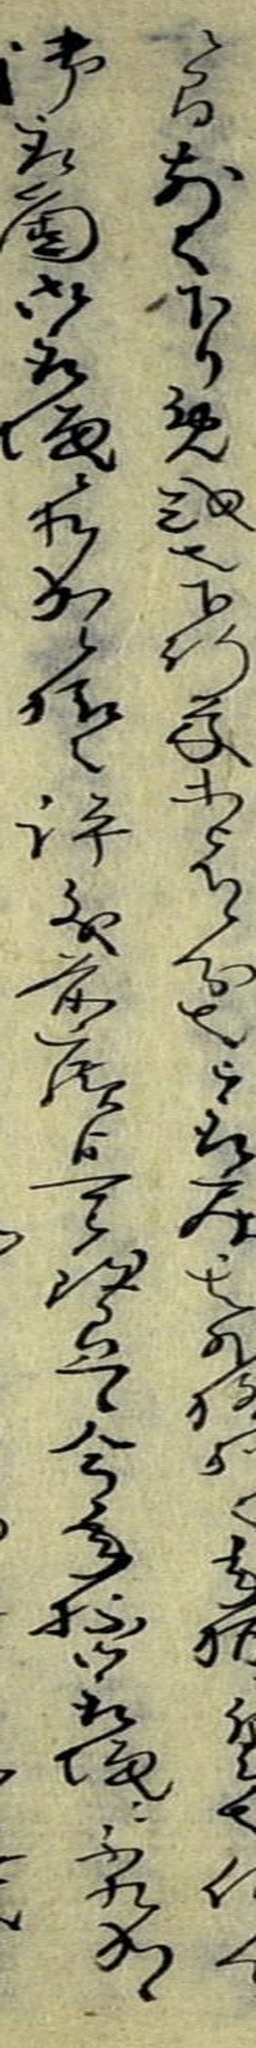御取箇御取増に相成候様之評義前広ゟ可被致置候今年抔御取増に不相成候
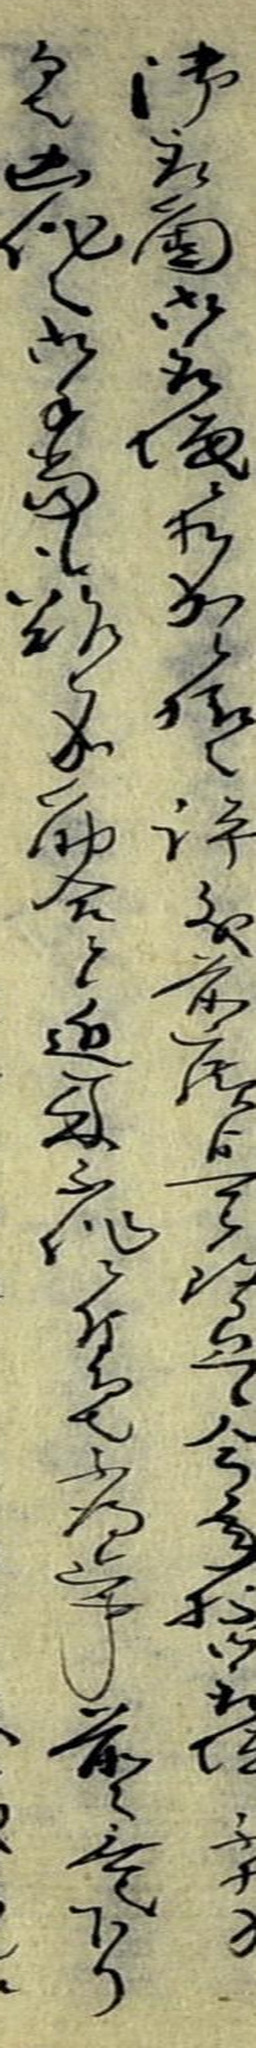而は凶作之御手当も難被成筋合に候近来不作に付而は不得止事前々無之下り
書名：命令之部 二
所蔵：福井県文書館 Fukui Prefectural Archives
